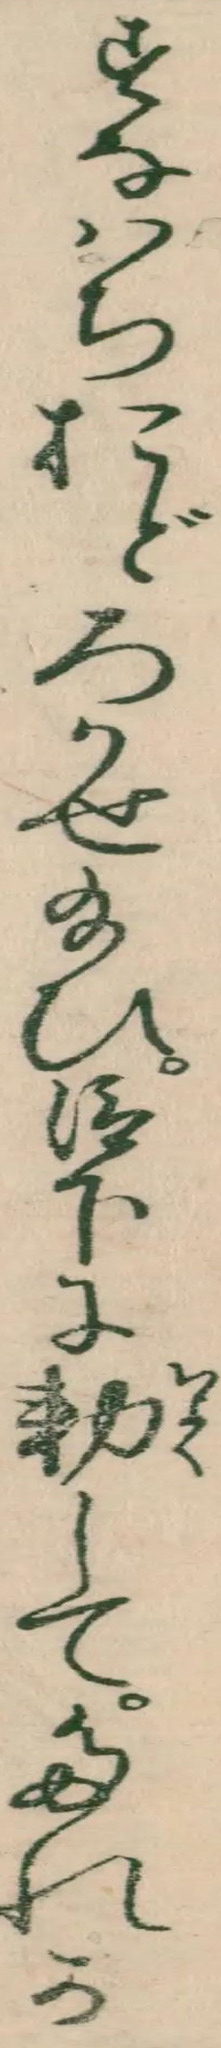すなはちおどろかせ給ひ。臣下に勅して。たれか
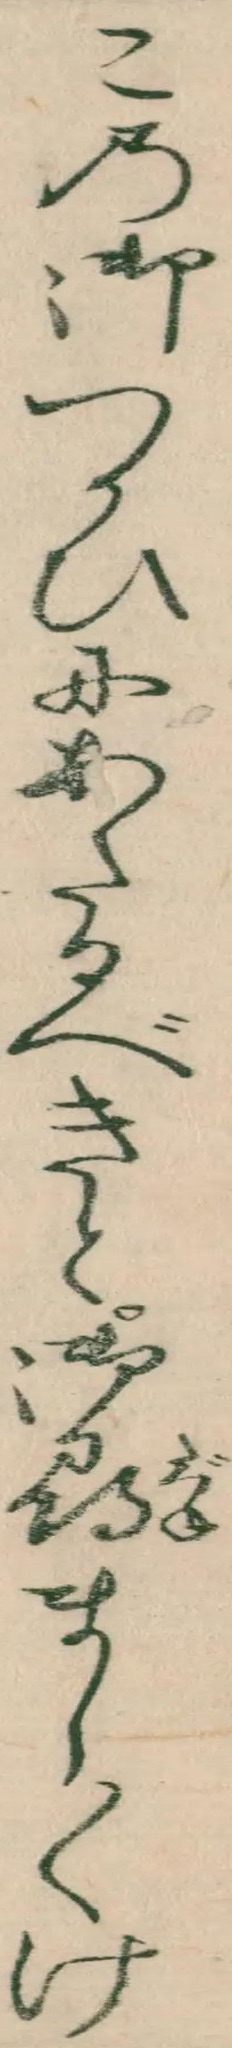この御つかひにあたるべきと。御尋まし〳〵け
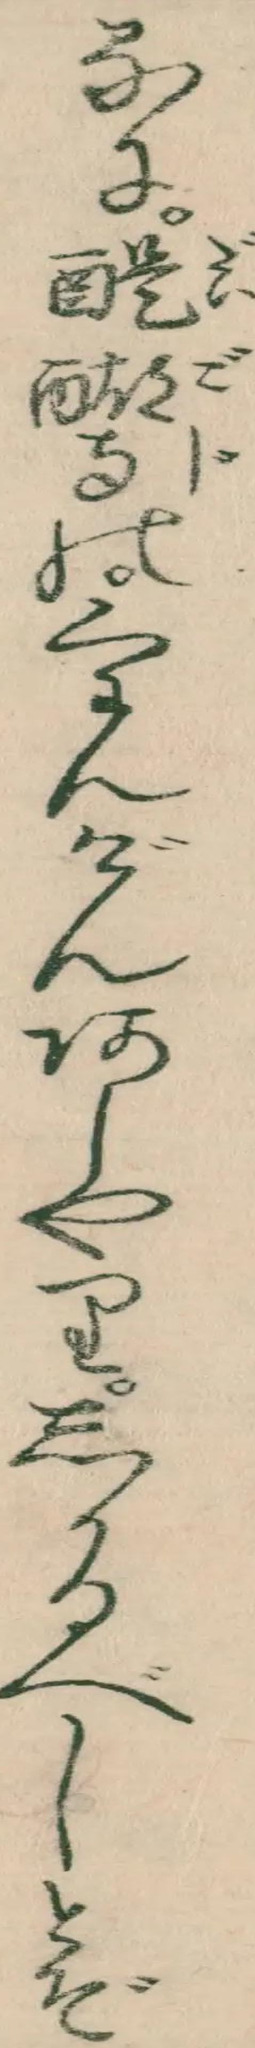るに。醍醐寺の。くわんげんあしやり。しかるべしとぞ
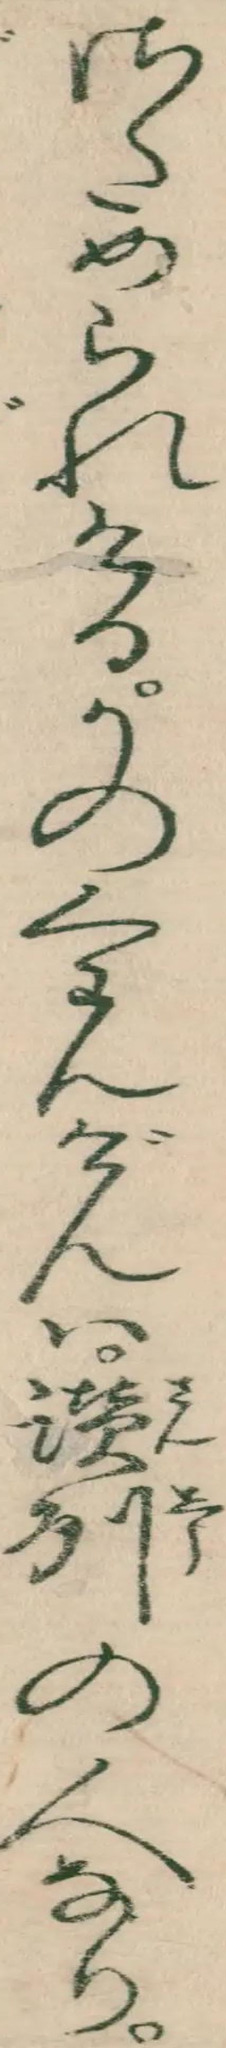さためられける。かのくわんげんは。讃州の人なり。
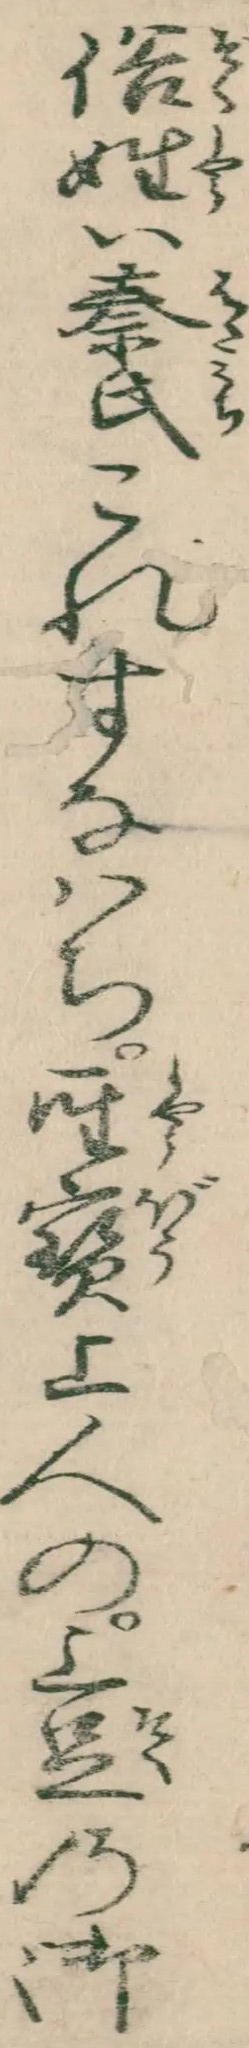俗姓は秦氏これすなはち。聖宝上人の。上足の御
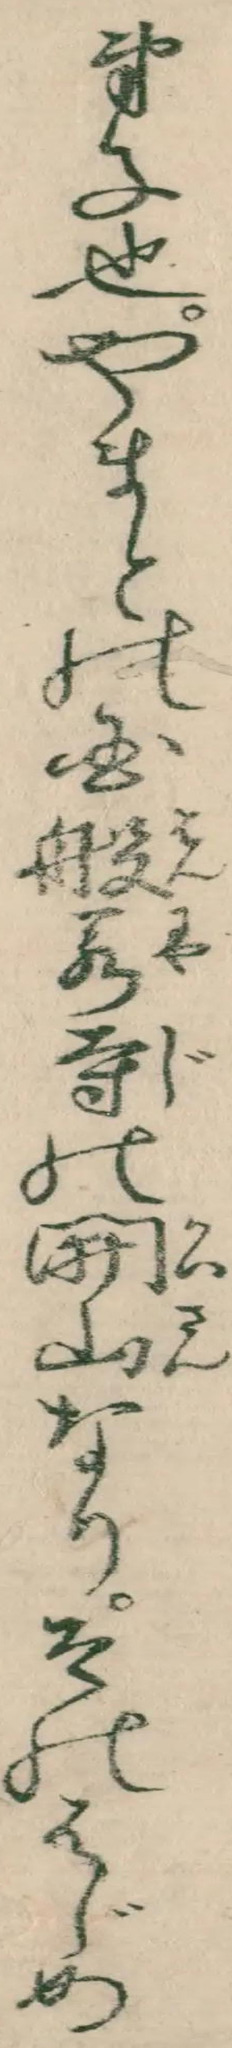弟子也。やまとの国般若寺の開山なり。そのはじめ
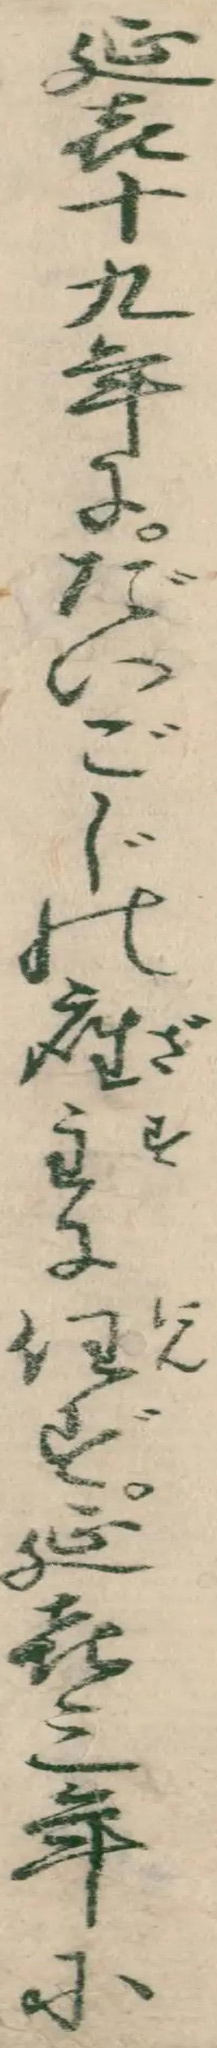延喜十九年に。だいごじの座主に任ず。延喜三年に
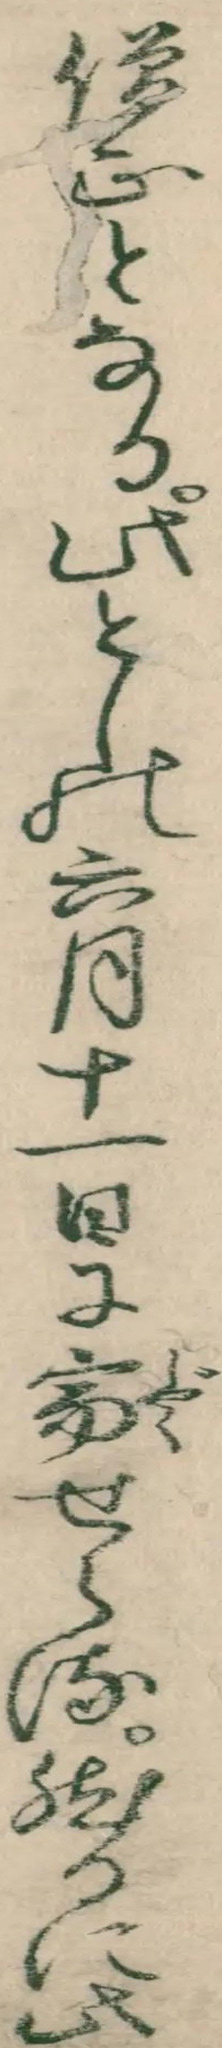僧正となる。此としの六月十一日に寂せらる。然るに此
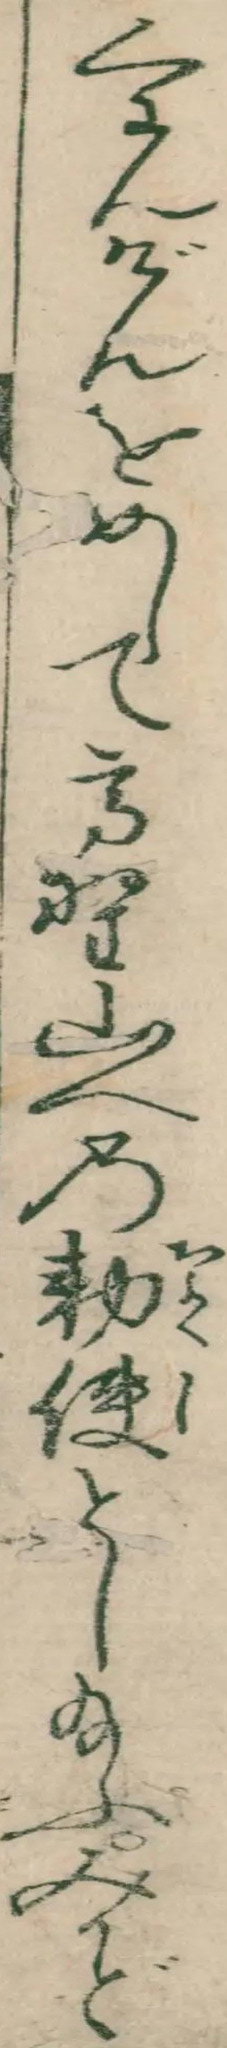くわんげんをめして高野山への勅使とし給ふ。みかど

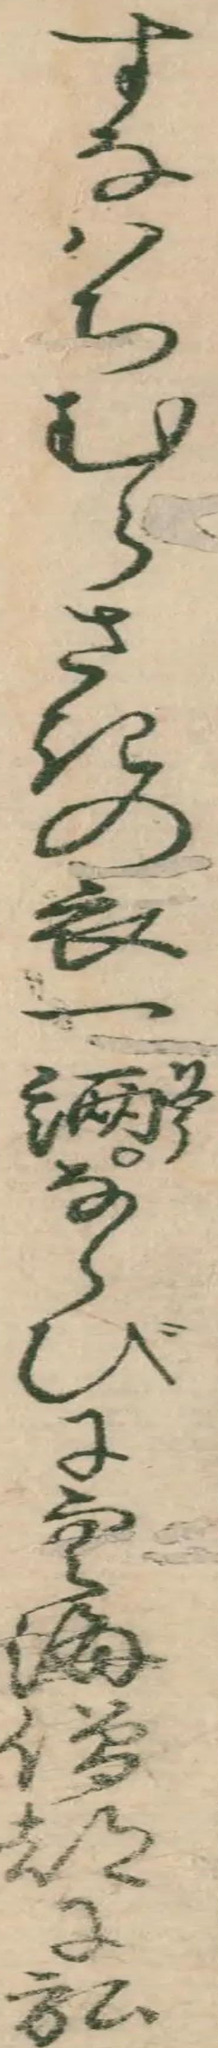すなはちむらさきの衣一裲ならびに空海僧都に弘
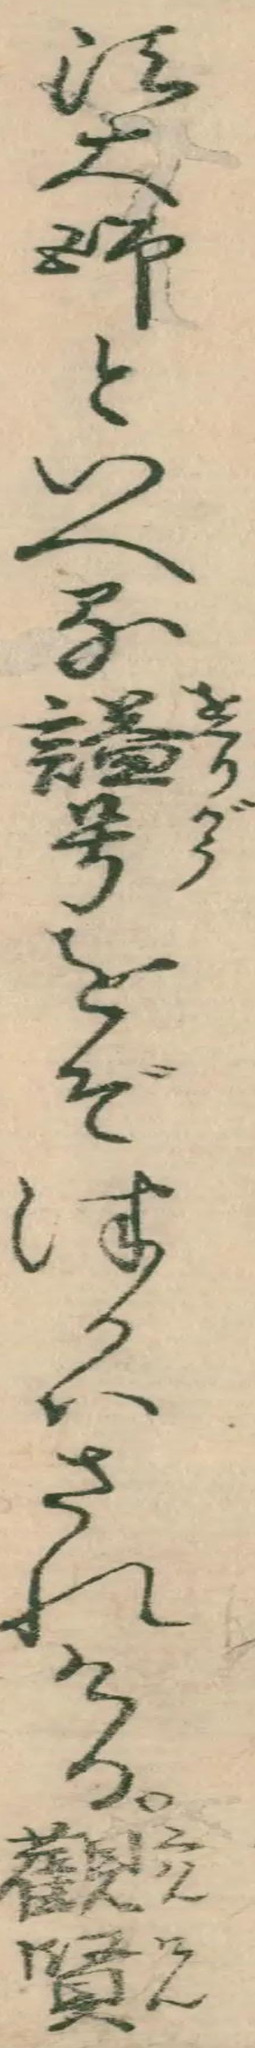法大師といへる謚号をぞつかはされける。観賢
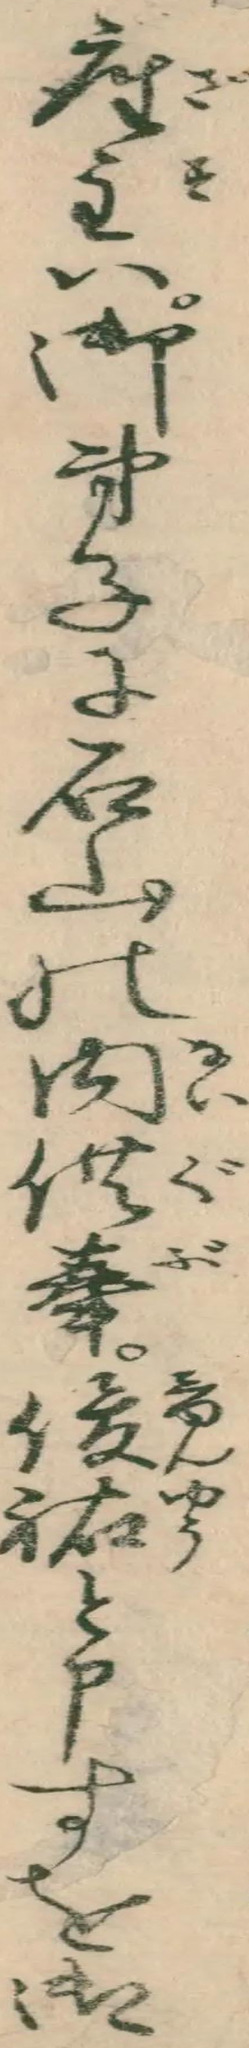座主は。御弟子に石山の内供奉。俊祐と申すを御
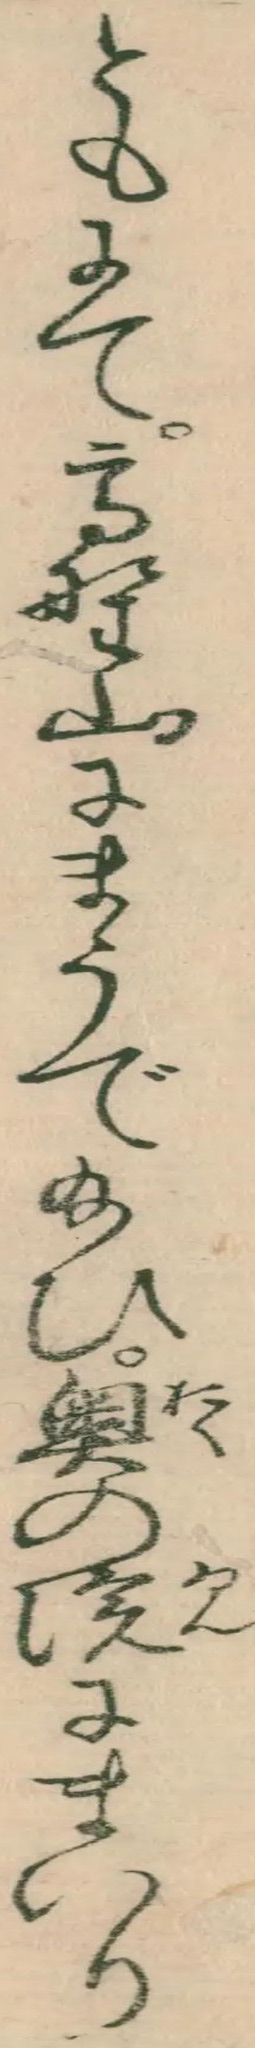ともにて。高野山にまうで給ひ。奥の院にまいり
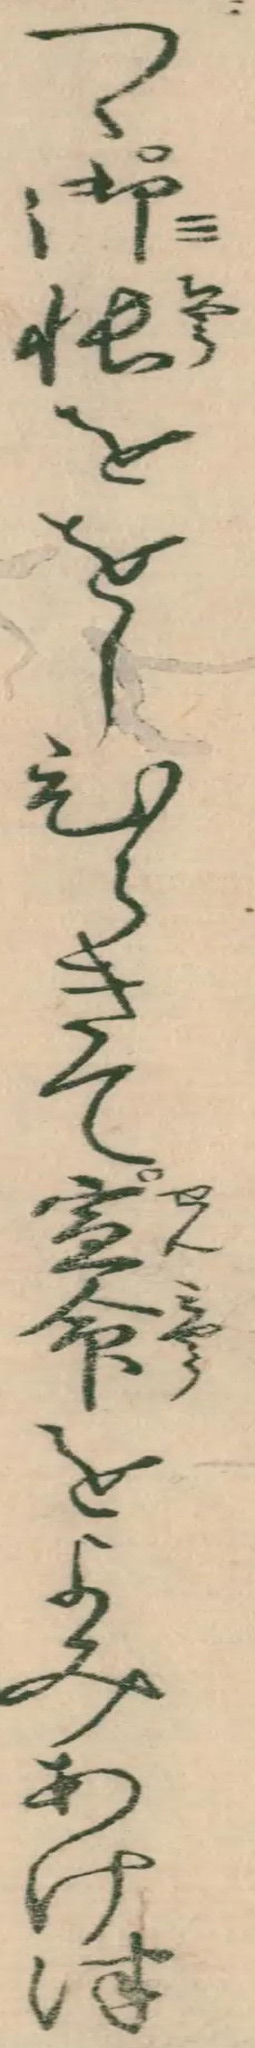つゝ。御帳ををしひらきて。宣命をよみあけつ
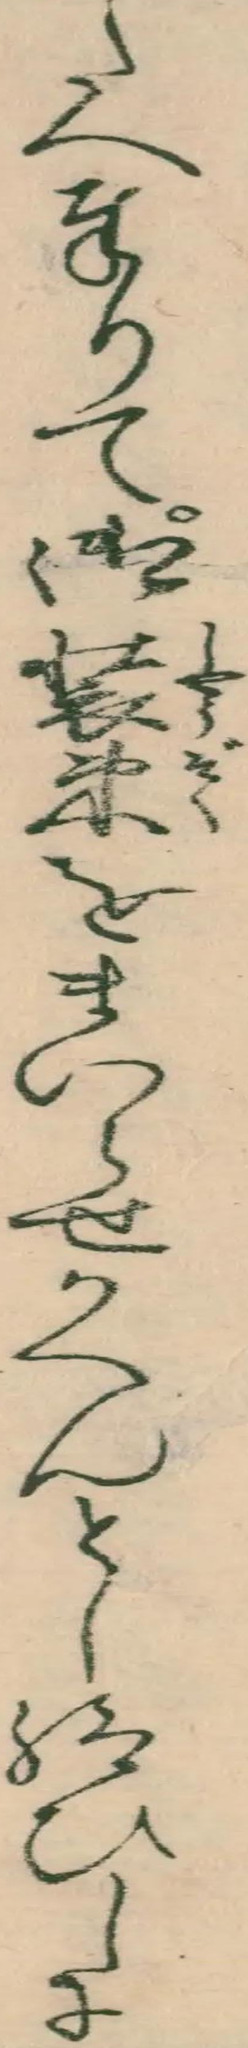たへ奉りて。御装束をまいらせかへんとし給ひしに
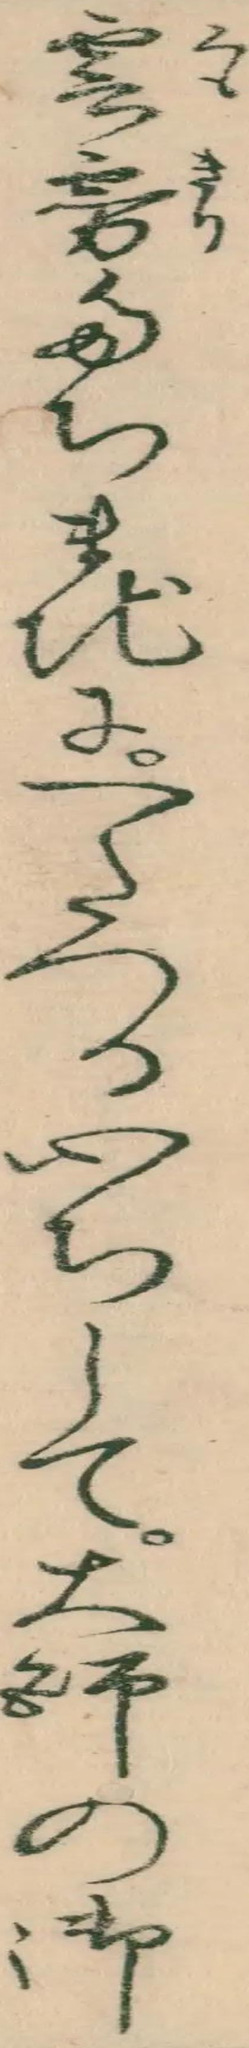雲霧たちまちに。へたつる心ちして。大師の御
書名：弘法大師御本地 3巻. [3]
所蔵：国立国会図書館 National Diet Library, JAPAN
